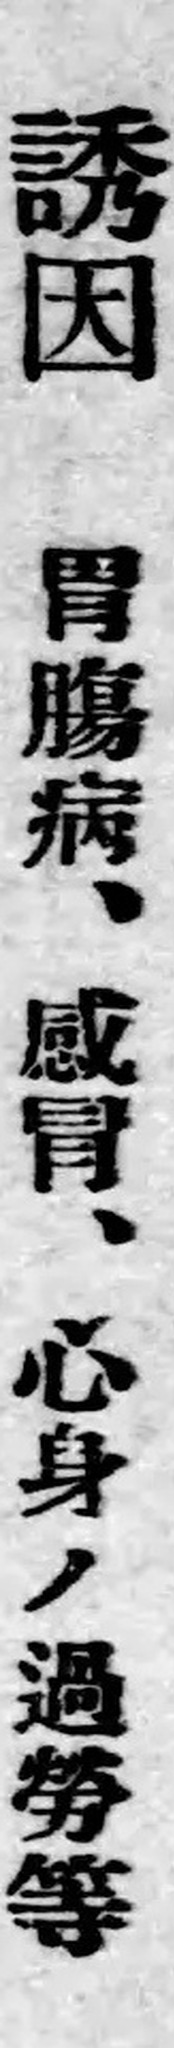誘因胃膓病、感冒、心身ノ過勞等
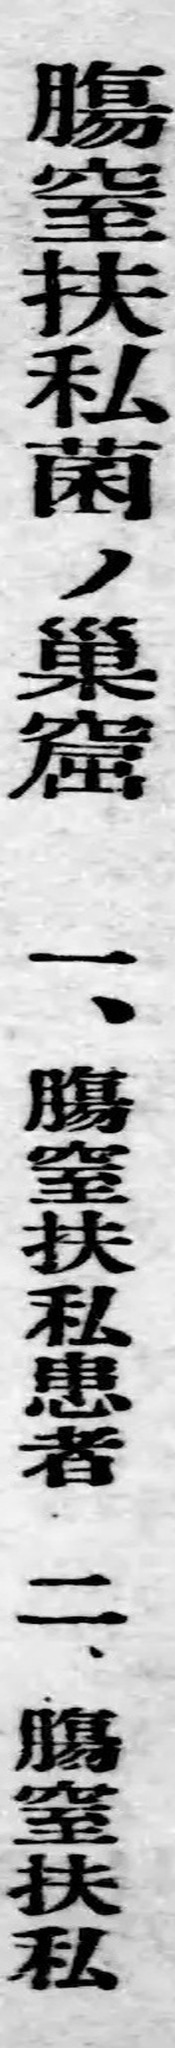膓窒扶私菌ノ巢窟一、膓窒扶私患者二、膓窒扶私
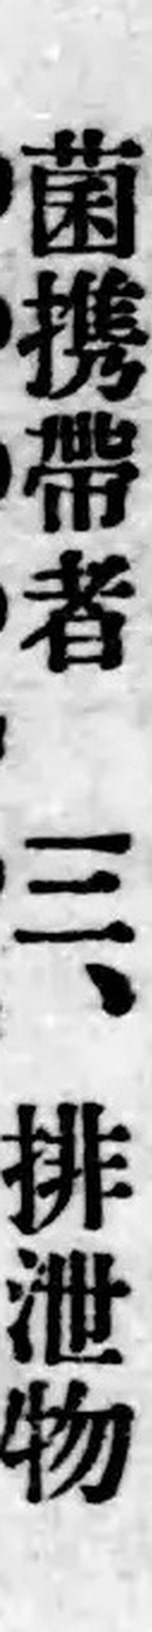菌携帶者三、排泄物
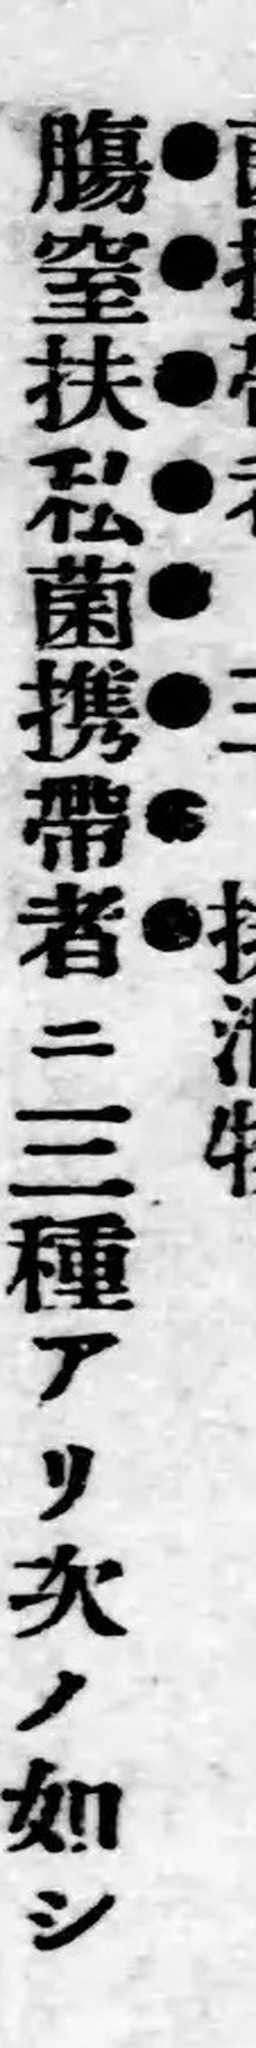膓窒扶私携帶者ニ三種アリ次ノ如シ
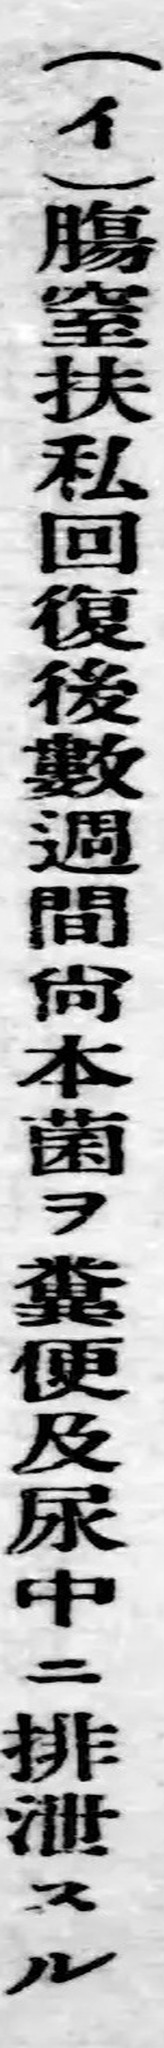(イ)膓窒扶私回復後數週間尚本菌ヲ糞便及尿中ニ排泄スル
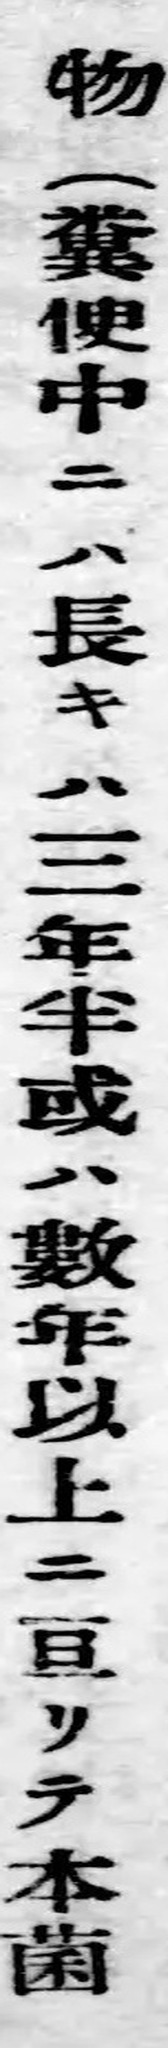者(糞便中ニハ長キハ三年半或ハ數年以上ニ亘リテ本菌
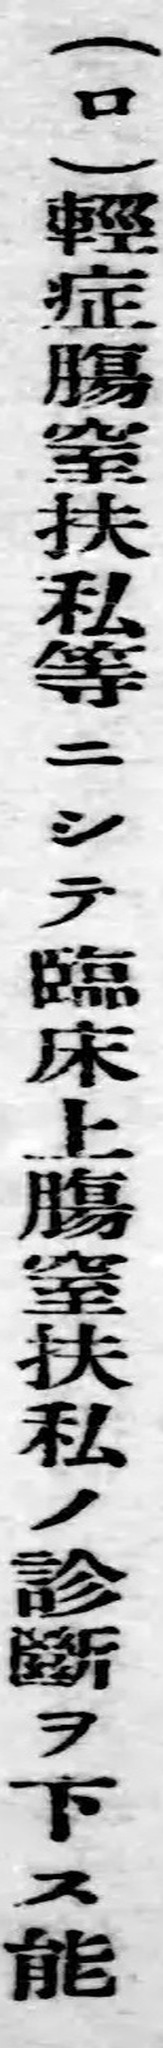(ロ)軽症膓窒扶私等ニシテ臨床上膓窒扶私ノ診斷ヲ下ス能
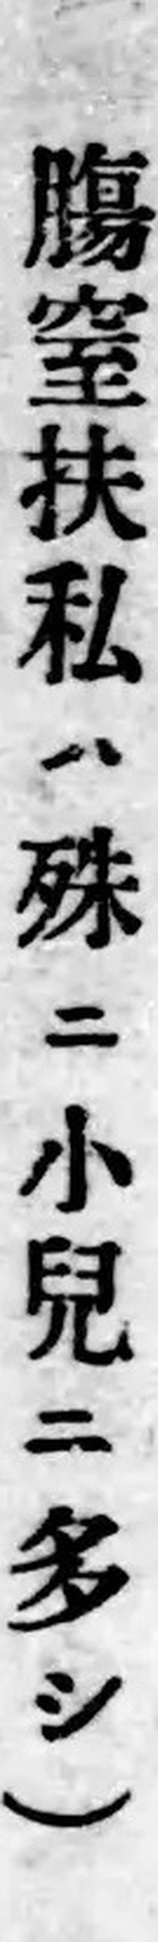膓窒扶私ハ殊ニ小兒ニ多シ)
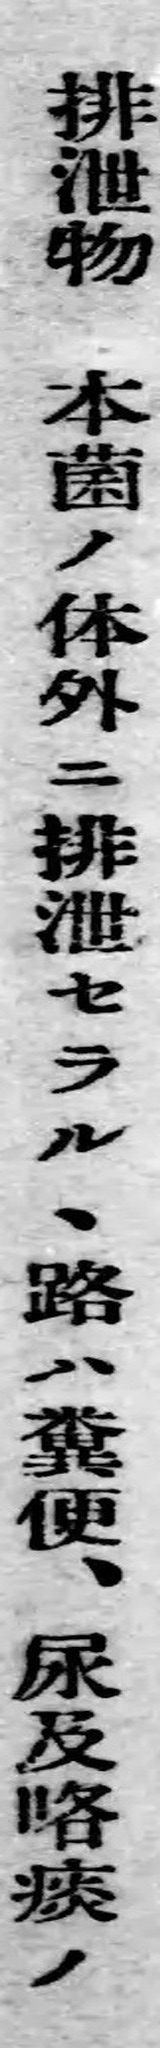排泄物本菌ノ体外ニ排泄セラルヽ路ハ糞便、尿及咯痰ノ
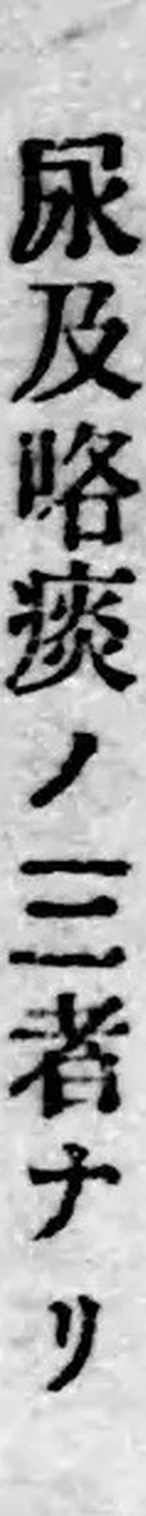尿及咯痰ノ三者ナリ
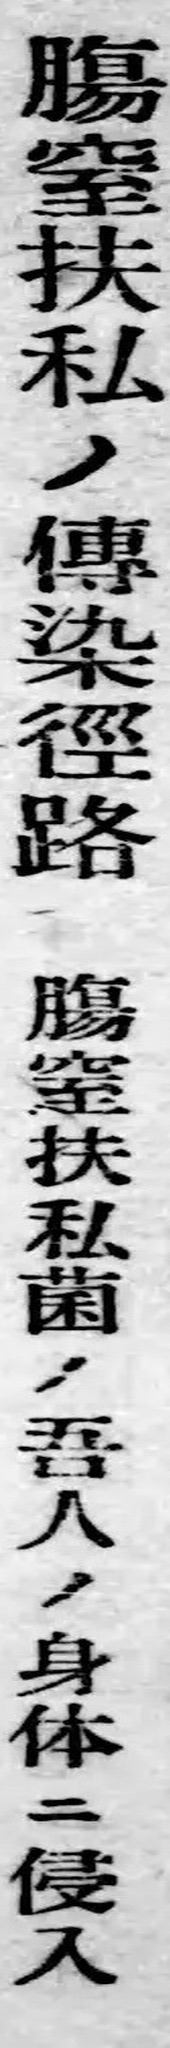膓窒扶私ノ傅染徑路膓窒扶私菌ノ吾人ノ身体ニ侵入
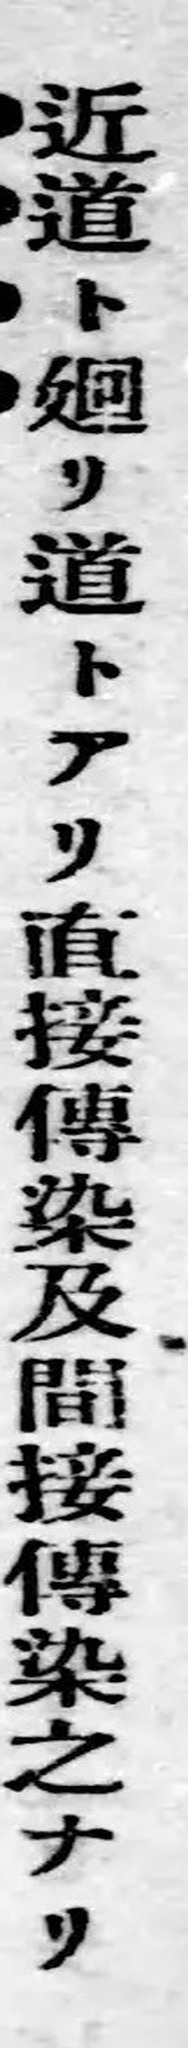近道ト廻リ道トアリ直接傅染及間接伝染之ナリ
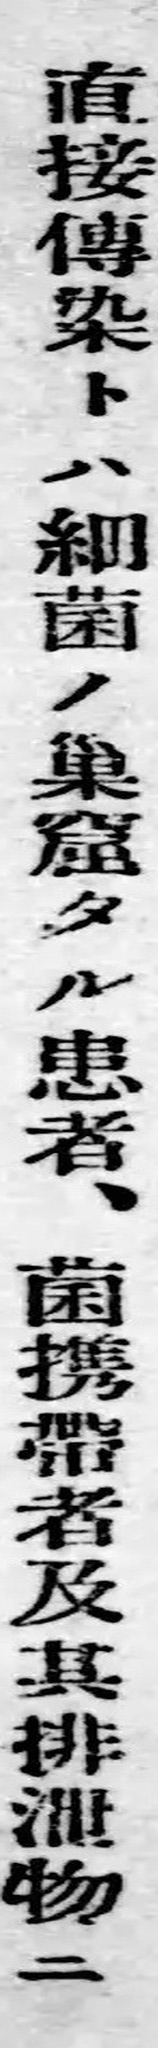直接傅染トハ細菌ノ巢窟タル患者、菌携帶者及其排泄物ニ
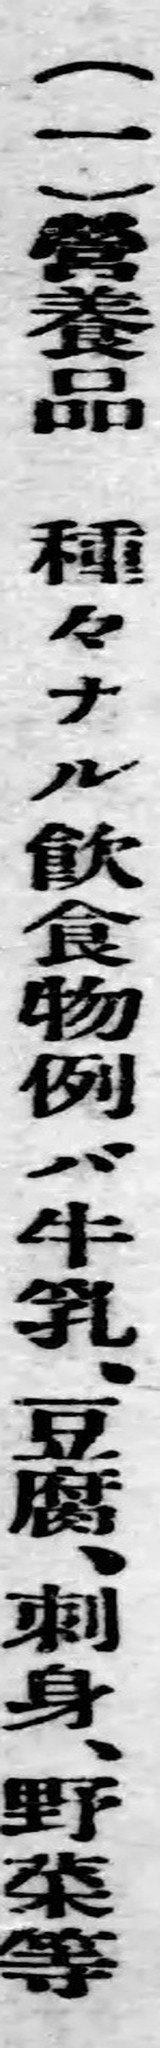(一)營養品種々ナル飮食物例バ牛乳、豆腐、刺身、野菜等
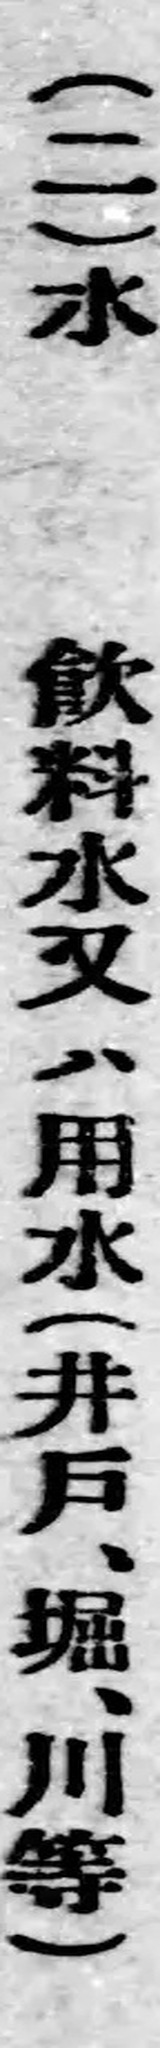(二)水飮料水又ハ用水(井戸、掘、川等)

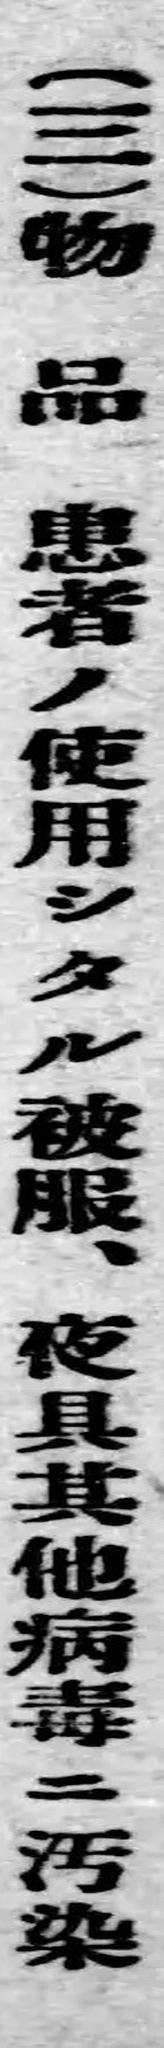(三)物品患者ノ使用シタル被服、夜具其他病毒ニ汚染
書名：袖珍防疫必携
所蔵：国立国会図書館 National Diet Library, JAPAN
